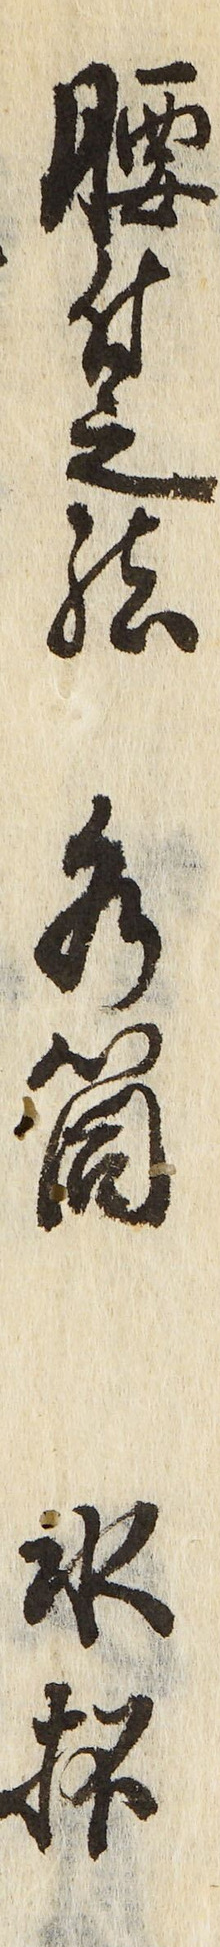腰付之緒水筒水杯
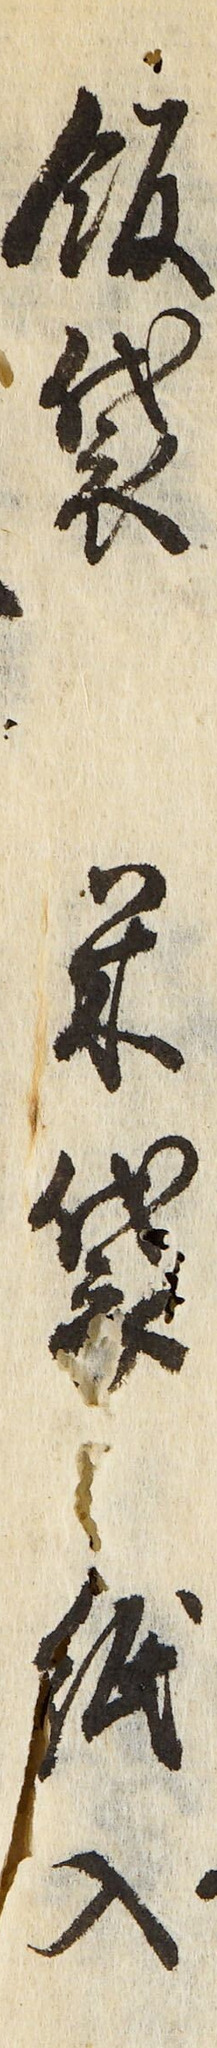飯袋米袋紙入

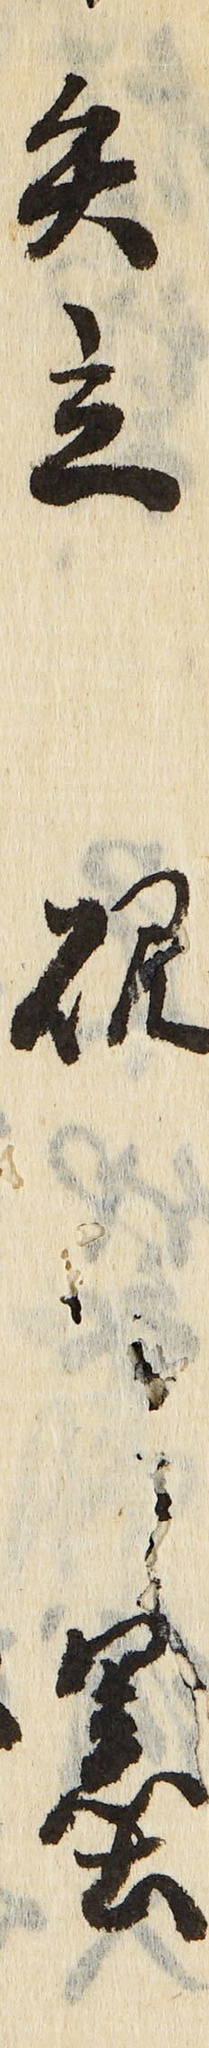矢立硯墨
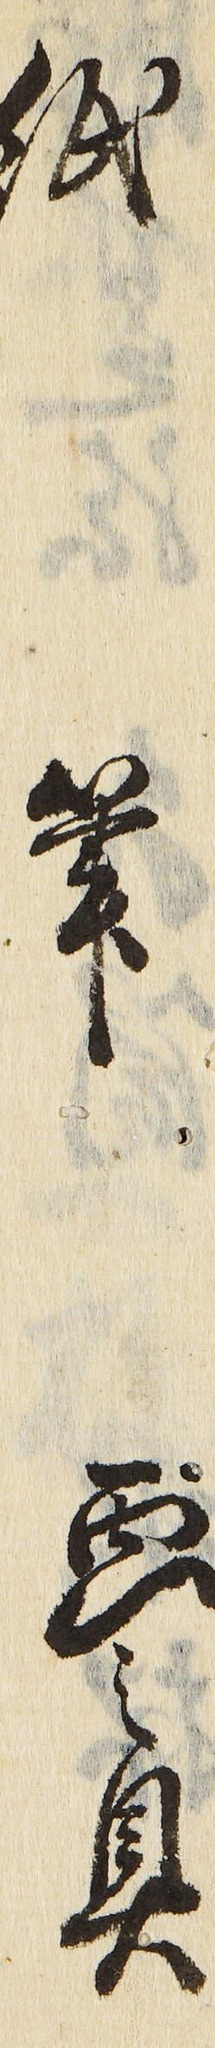紙筆画之具
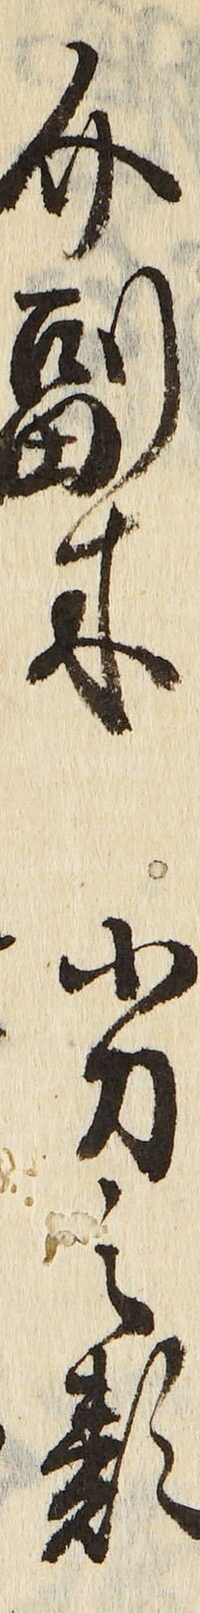介副木小刀之類
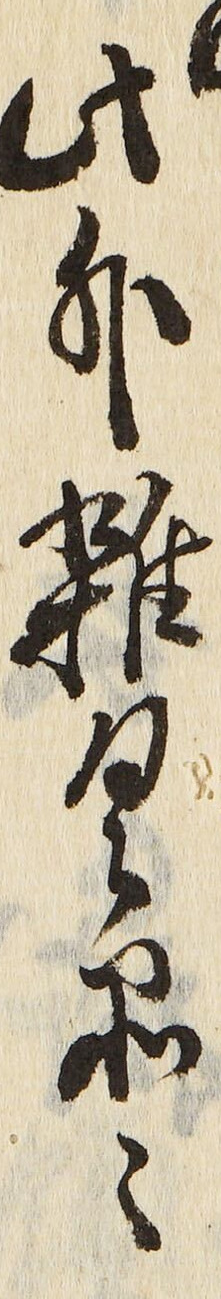此外雑具品々
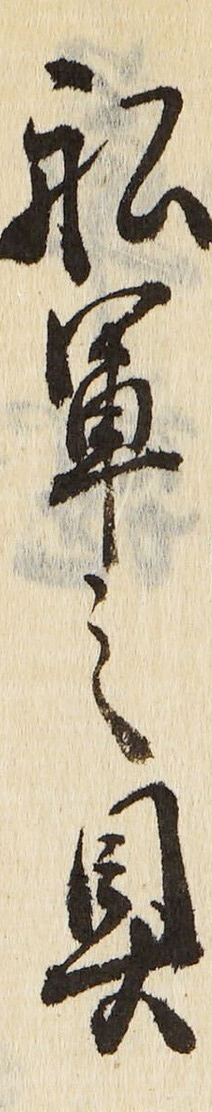船軍之具
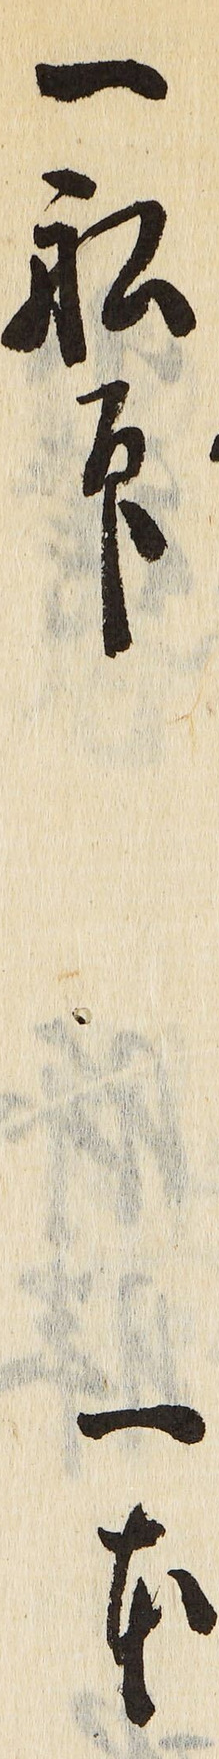一船印一本
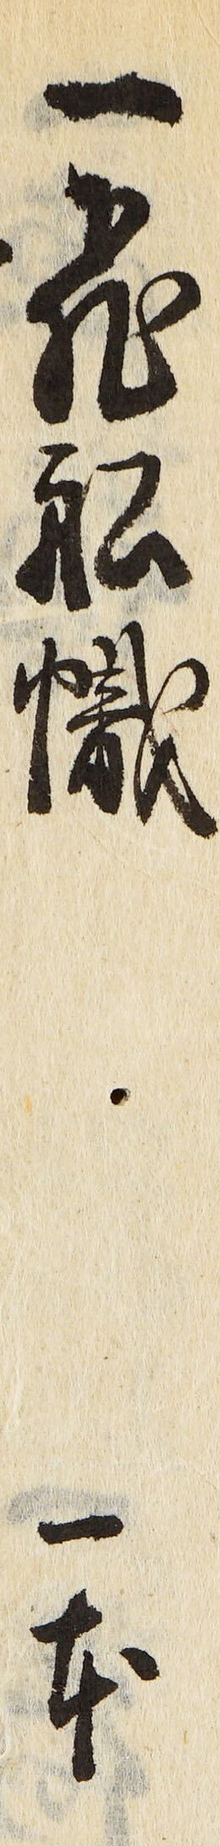一飛船幟一本
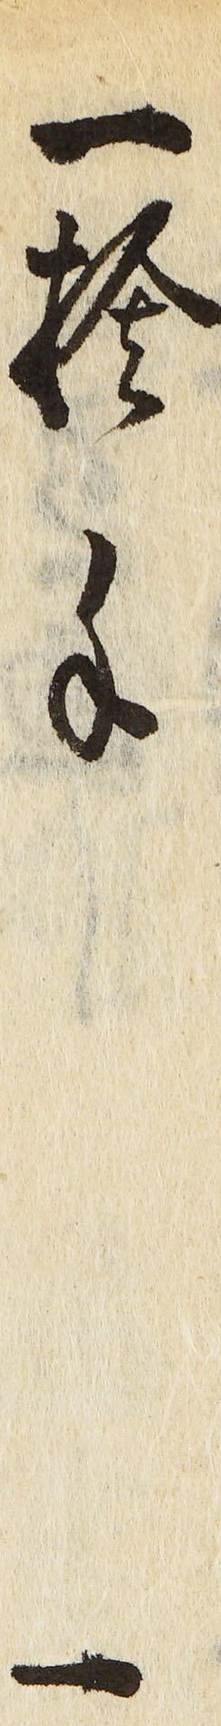一捨手一
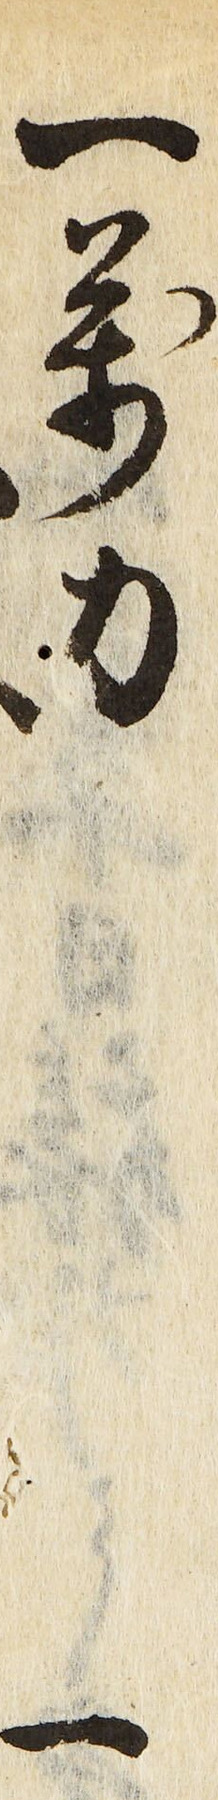一万力一
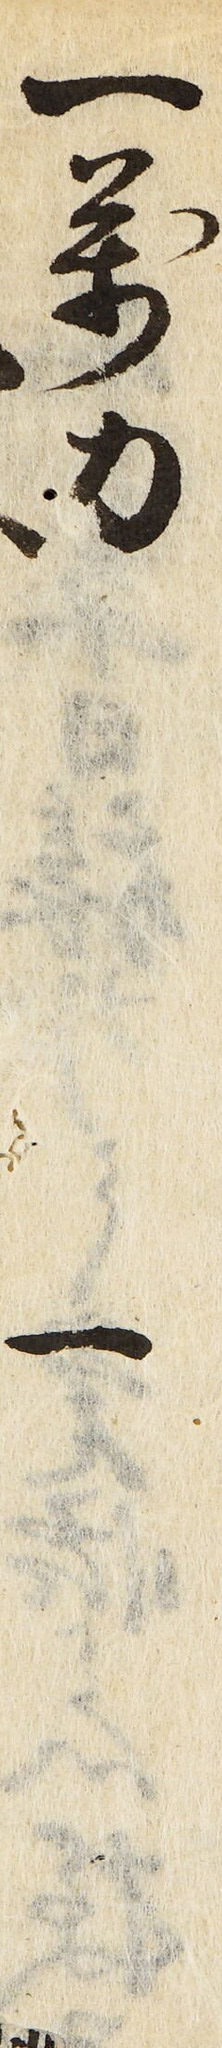一万力一
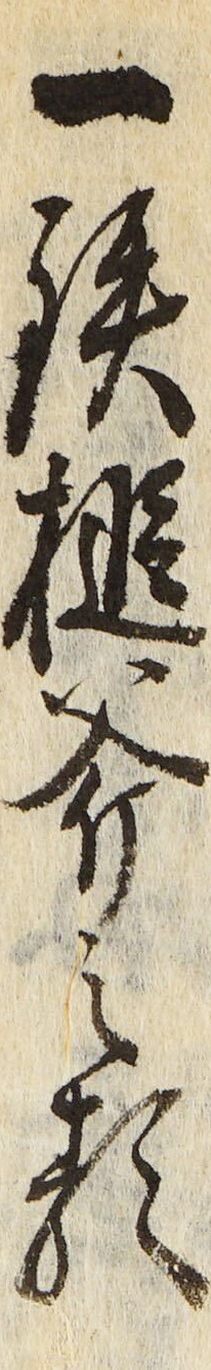一鉄槌斧之類
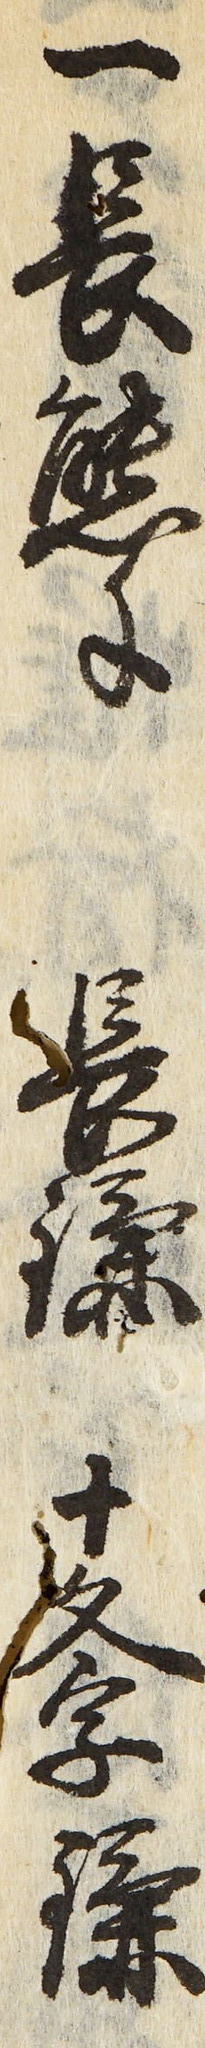一長熊手長鎌十文字鎌
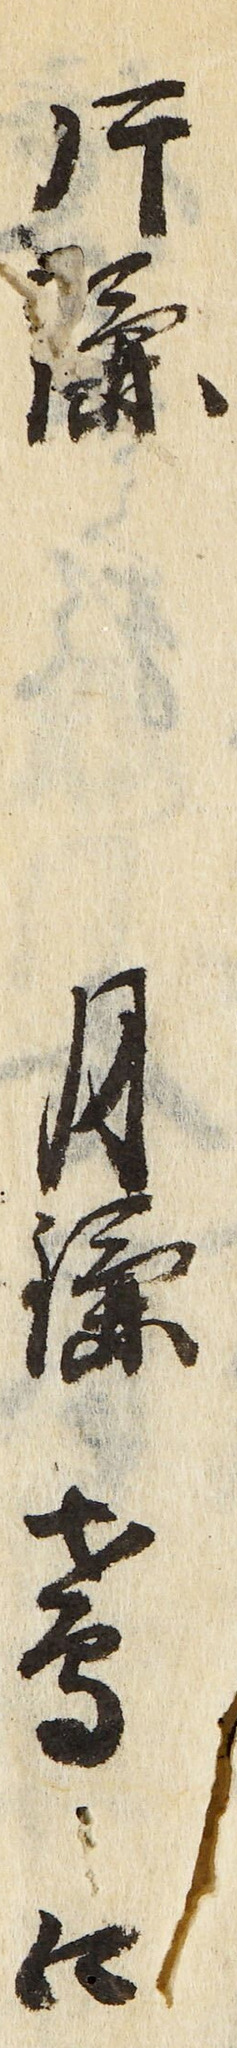片鎌月鎌鳶口

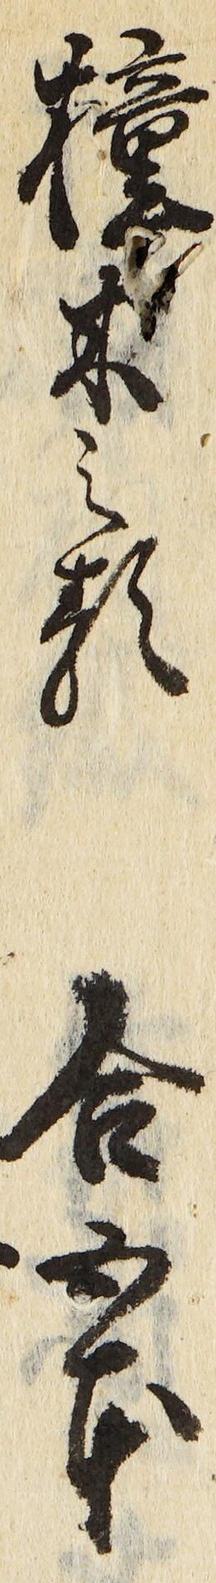撞木之類合五本
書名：御領海江異国船漂流有之節御手当之次第大組頭心得之廉々書集記
